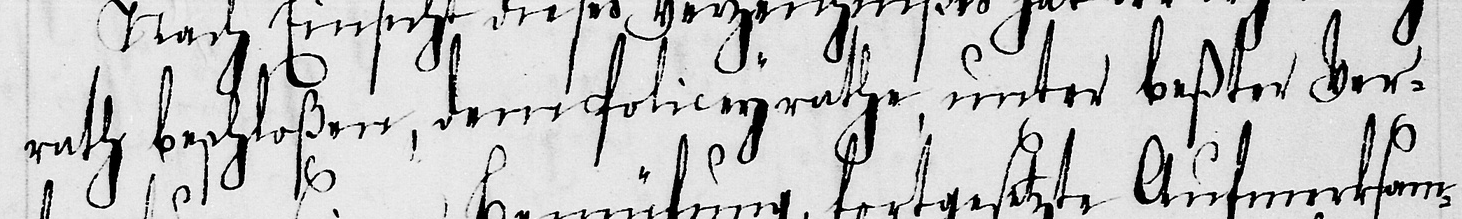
rath beschloßen, dem Policeyrathe, unter beßter Ver¬
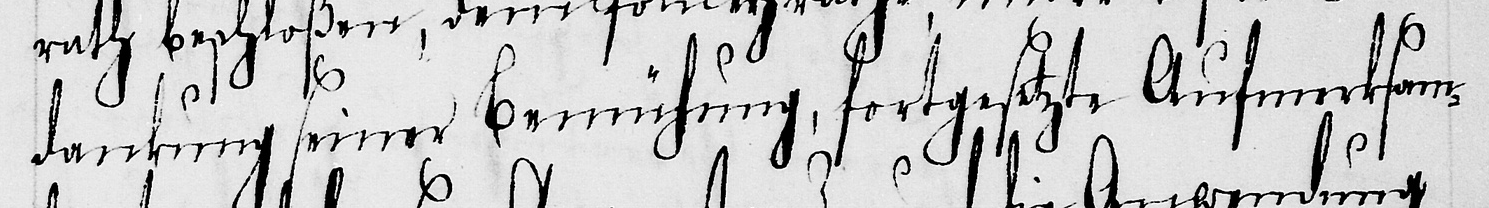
dankung seiner Bemühung, fortgesetzte Aufmerksam¬
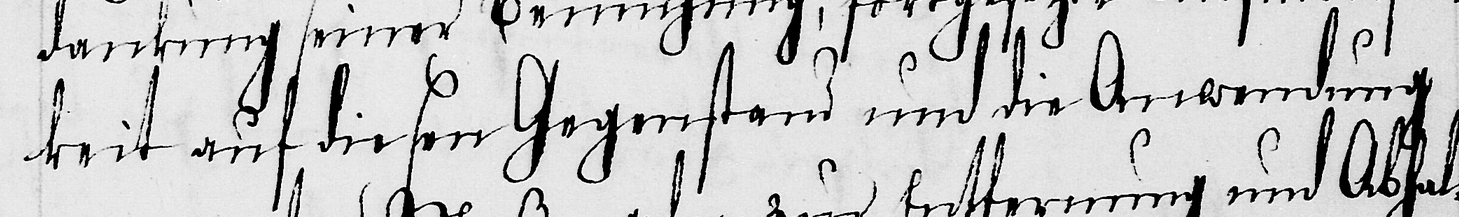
keit auf diesen Gegenstand und die Anwendung
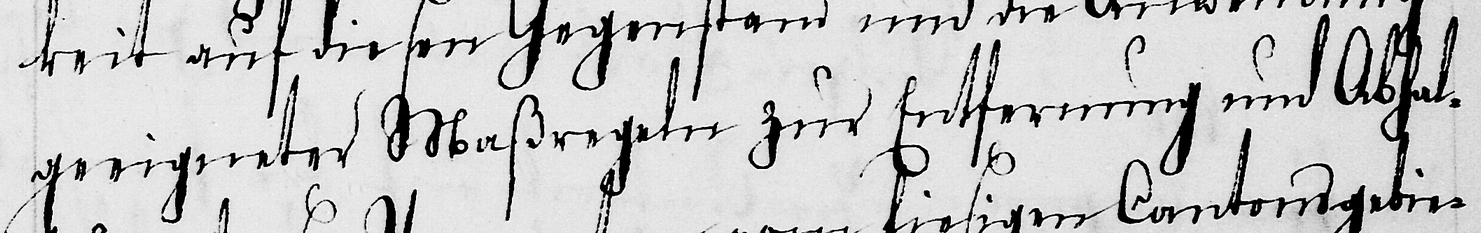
geeigneter Maßregeln zur Entfernung und Abhal¬
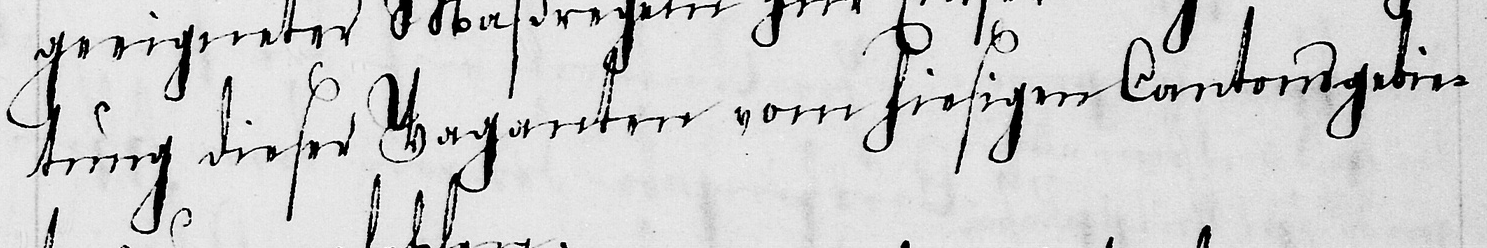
tung dieser Vaganten von hiesigen Cantonsgebie¬
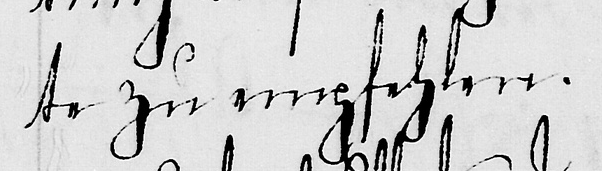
te zu empfehlen.
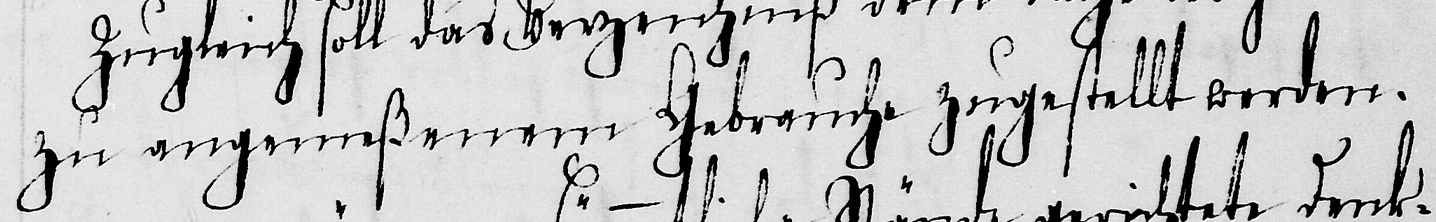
zu angemeßenem Gebrauche zugestellt werden.
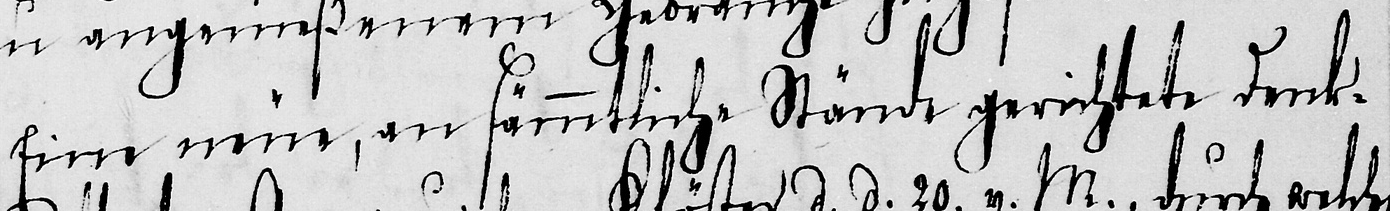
Eine neue, an sämmtliche Stände gerichtete Danks¬
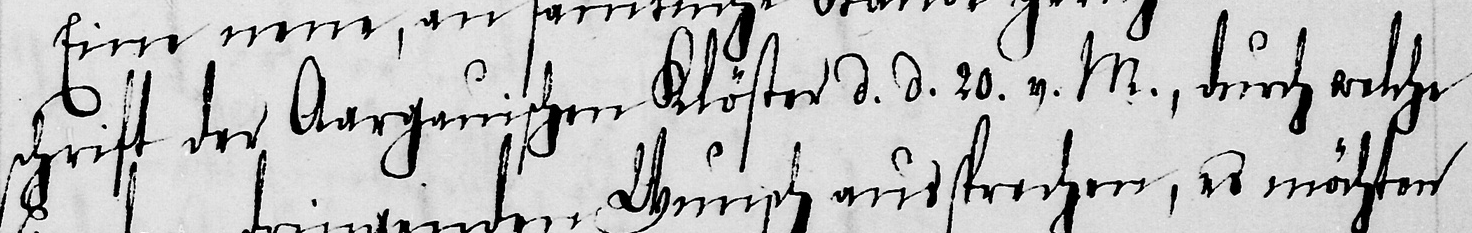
chrift der Aargauischen Klöster d. d. 20. v. M., durch welche
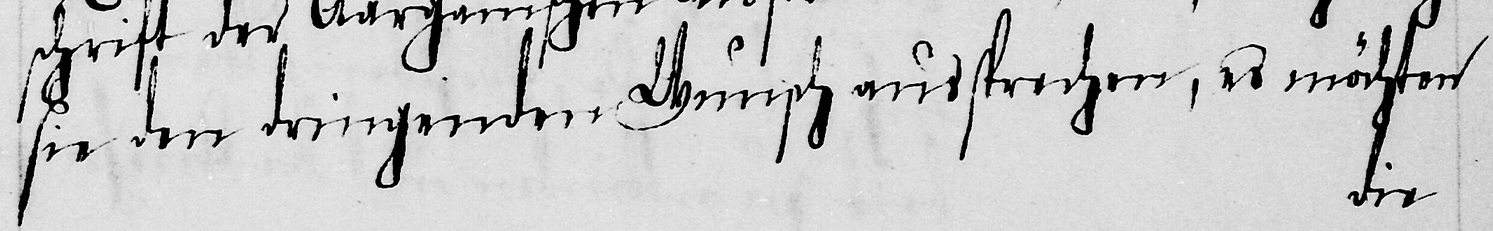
sie den dringenden Wunsch aussprechen, es möchten
